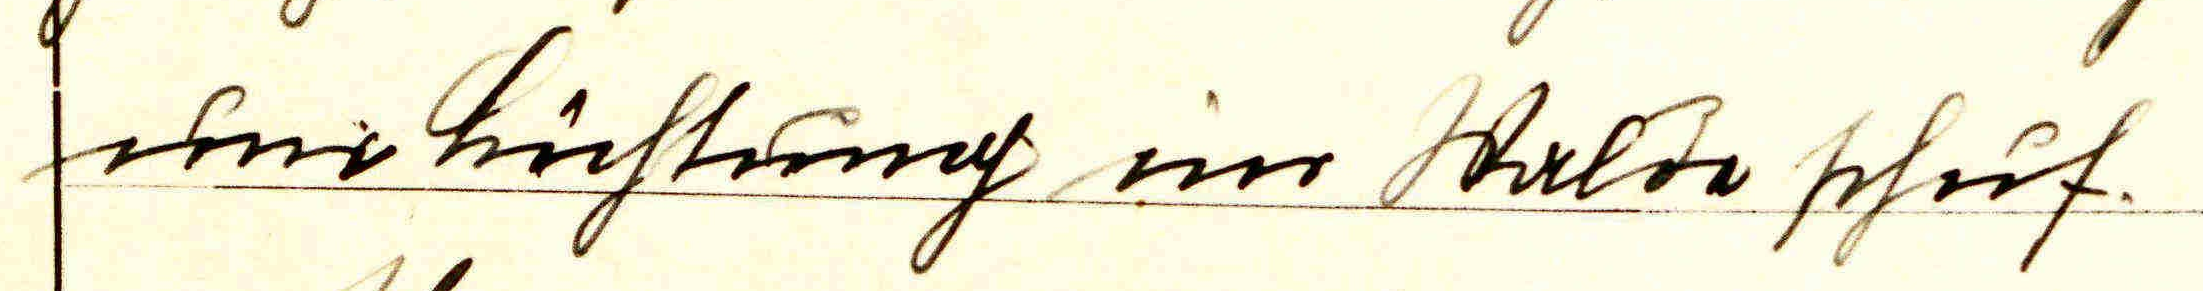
um Lichting im Walde schuf.
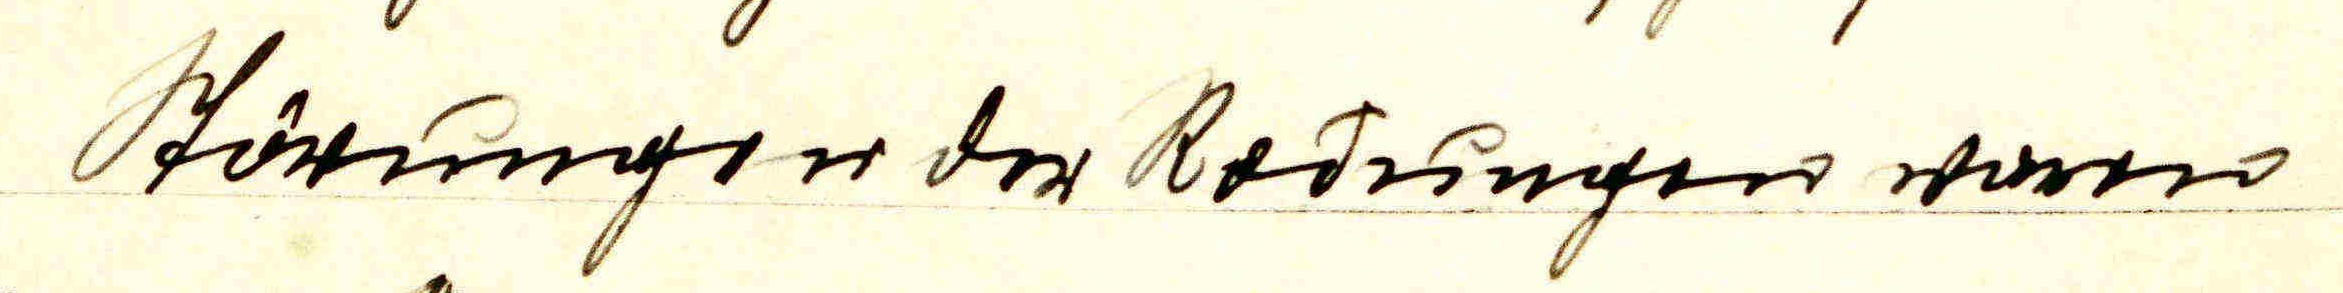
Störungen der Rodungen waren
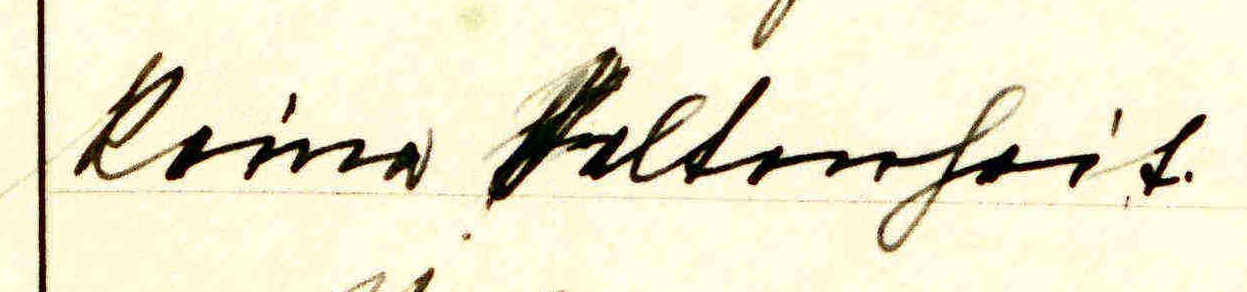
keine Seltenheit.
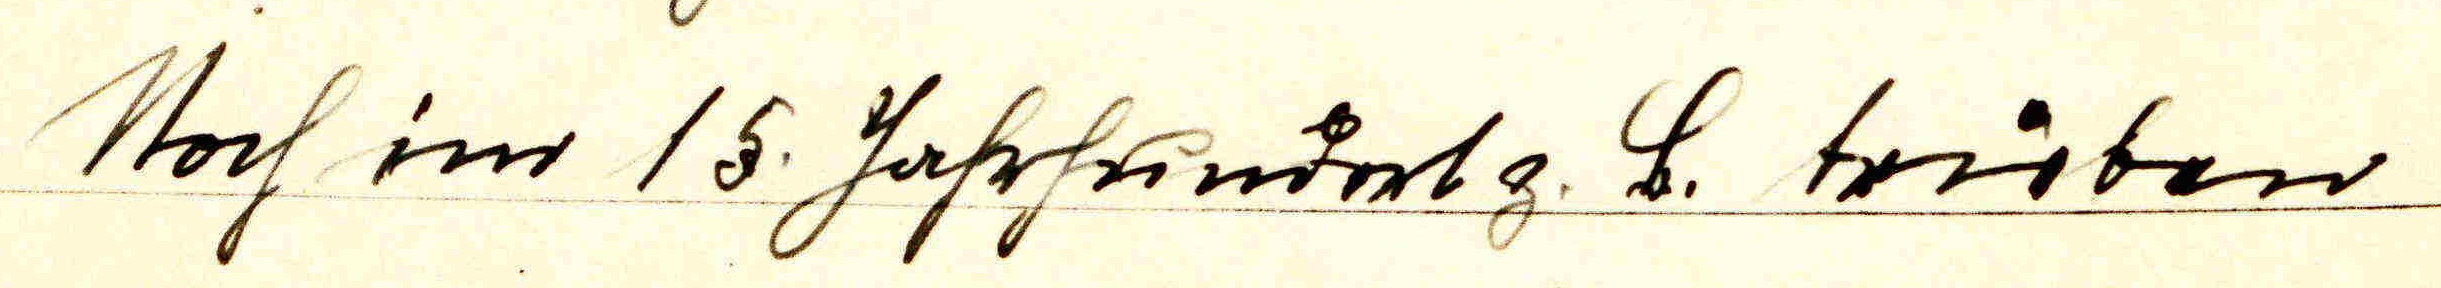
Noch im 15. Jahrhundert z.B. trieben
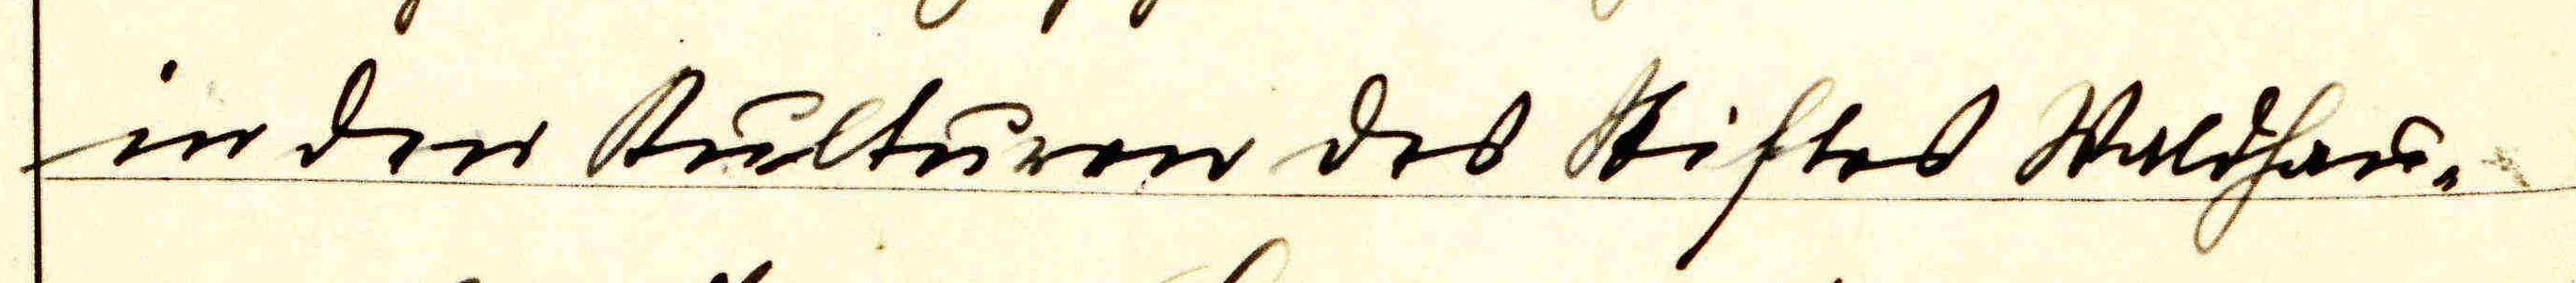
in den Kulturen des Stiftes Waldhau-
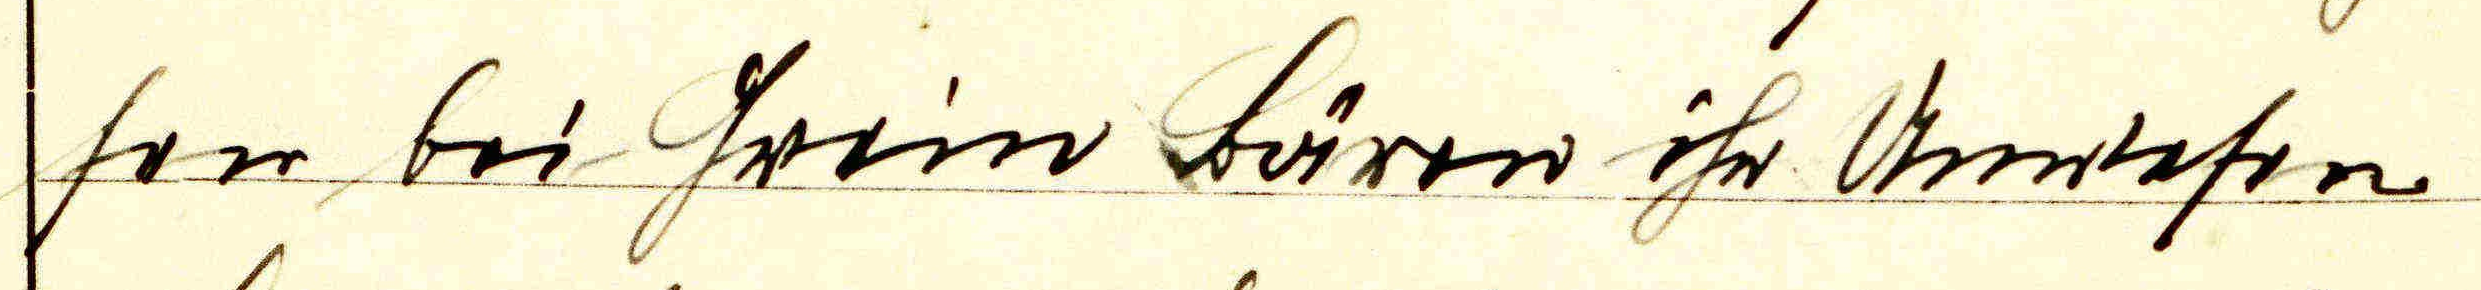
sen bei Grein Bären ihr Unwesen.
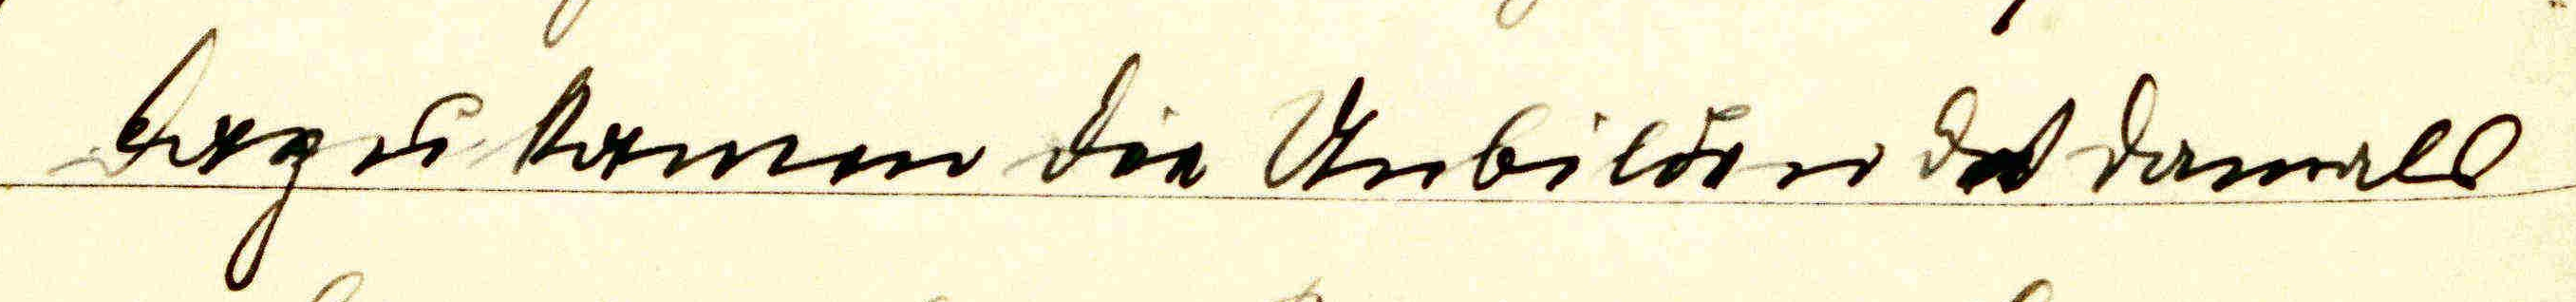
Dazu kamen die Anbilden des damals
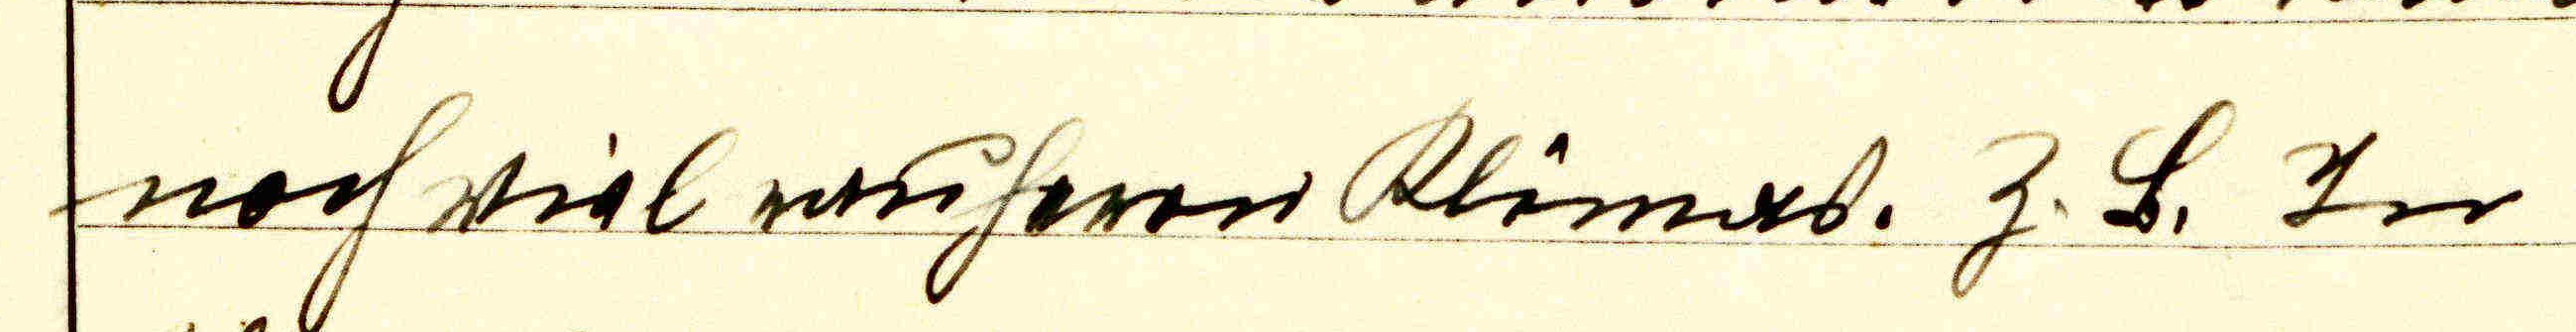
noch viel rauheren Klimas. z.B. In
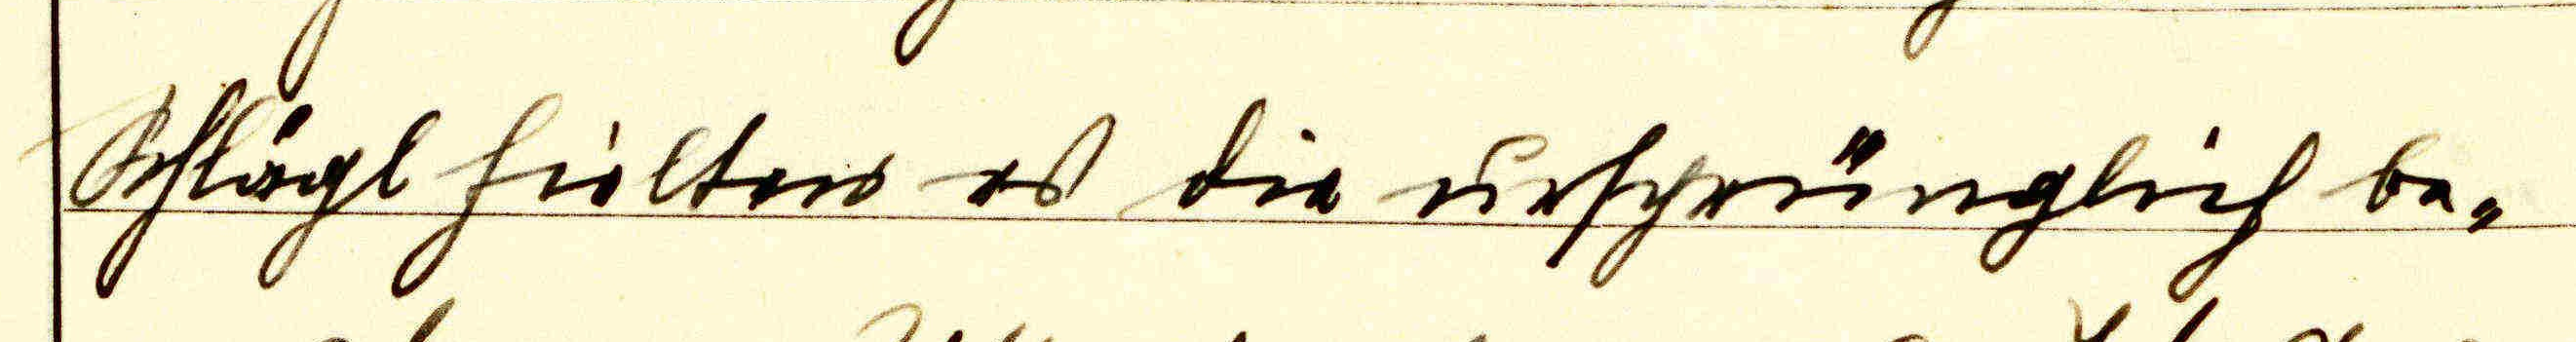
Schlägl hielten es die ursprünglich be-
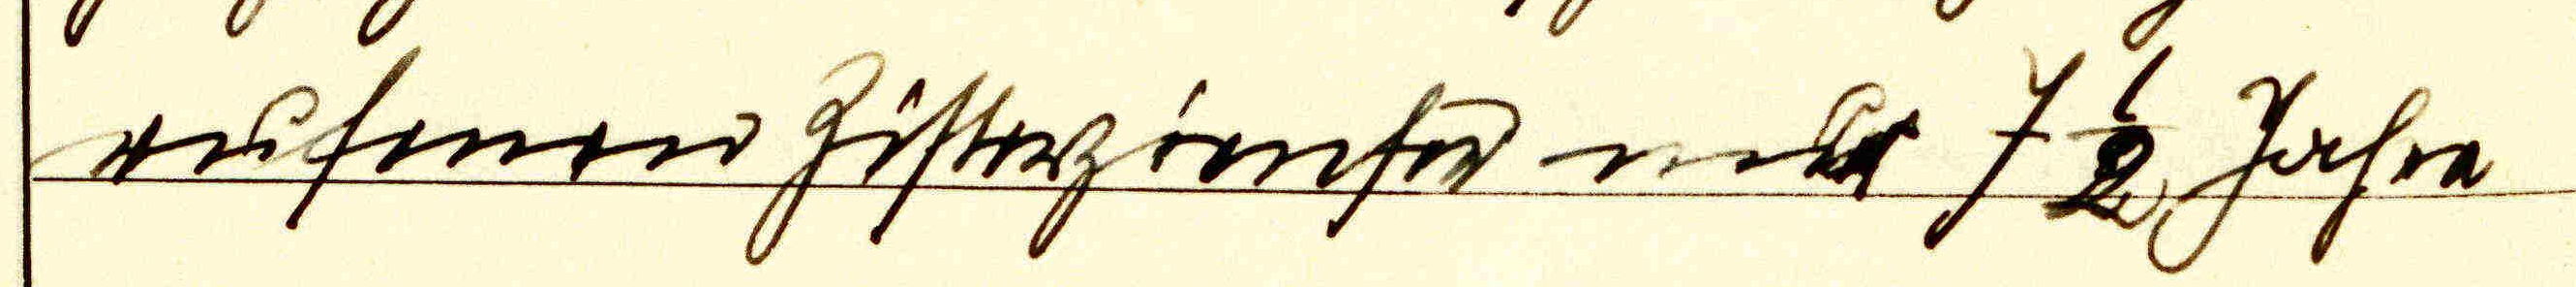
rufenen Zisterzienser nur 7 1/2 Jahre
